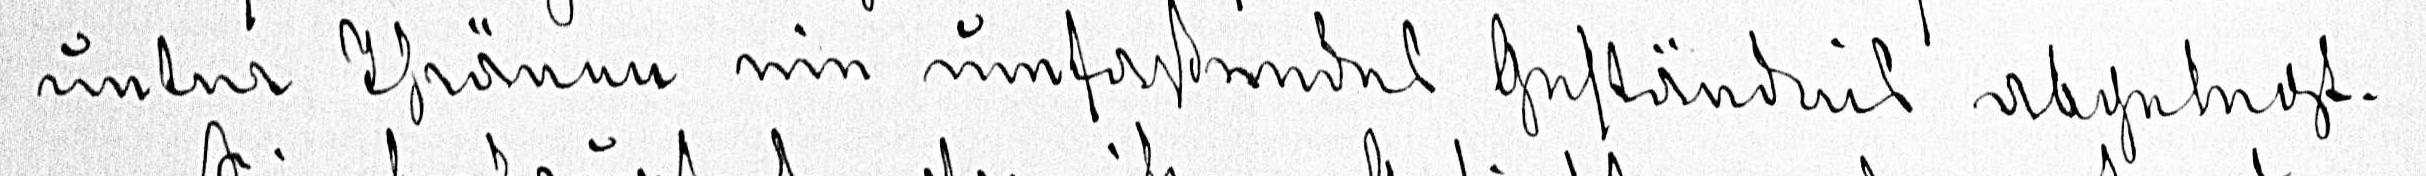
unter Thränen ein umfaßendes Geständnis abgelegt.
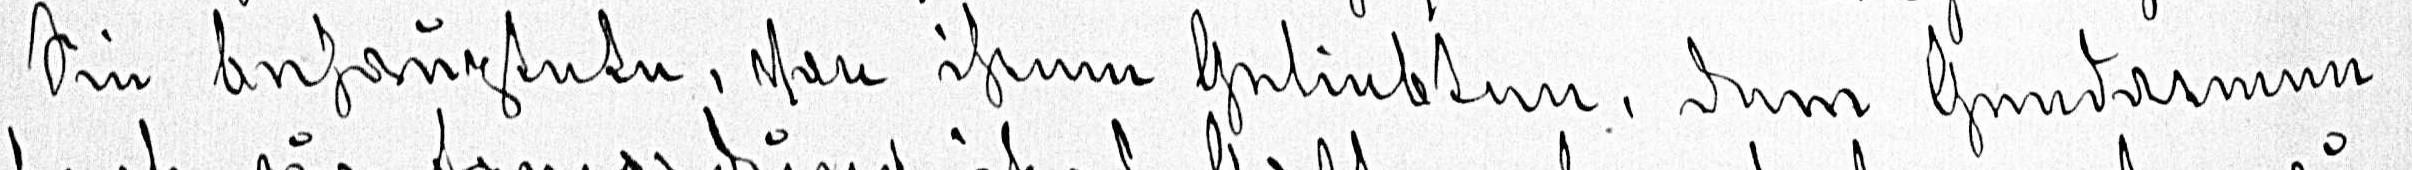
Sie behauptete, von ihren Geliebten, dem Gendarmen
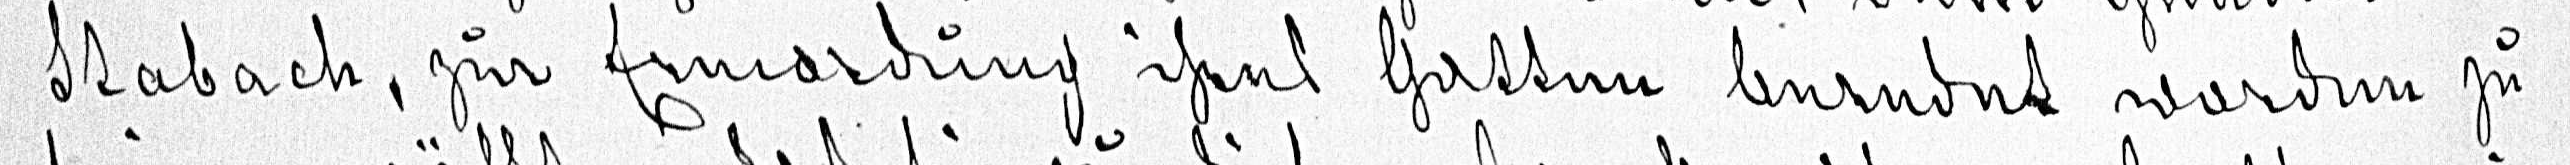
Stabach, zur Ermordung ihres Gatten beredet worden zu
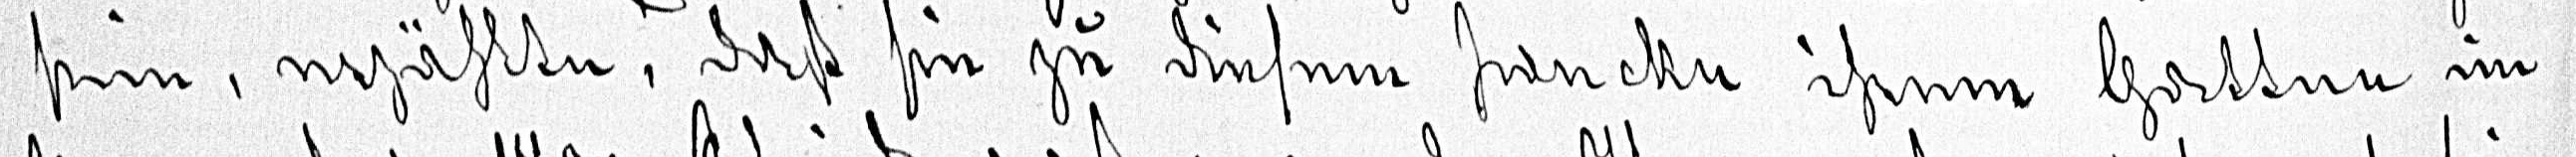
sein, erzählte daß sie zu diesem Zwecke ihrem Gatten im
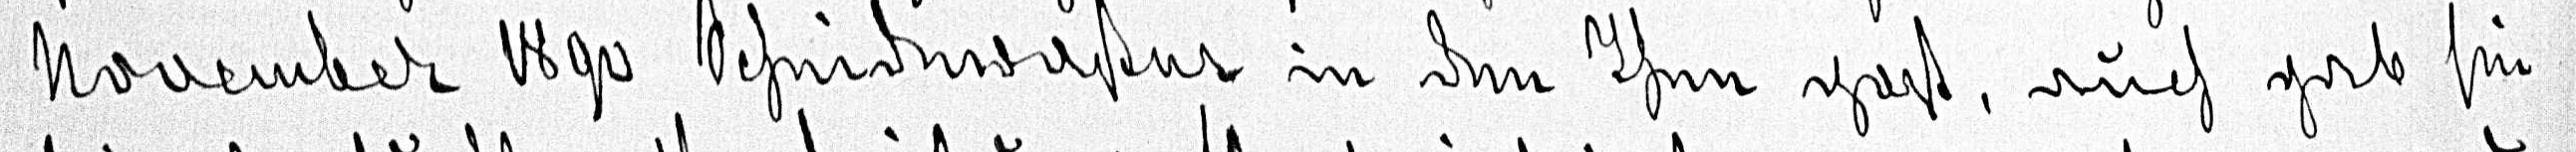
November 1890 Scheidewaßer in den Thee goß, auch gab sie
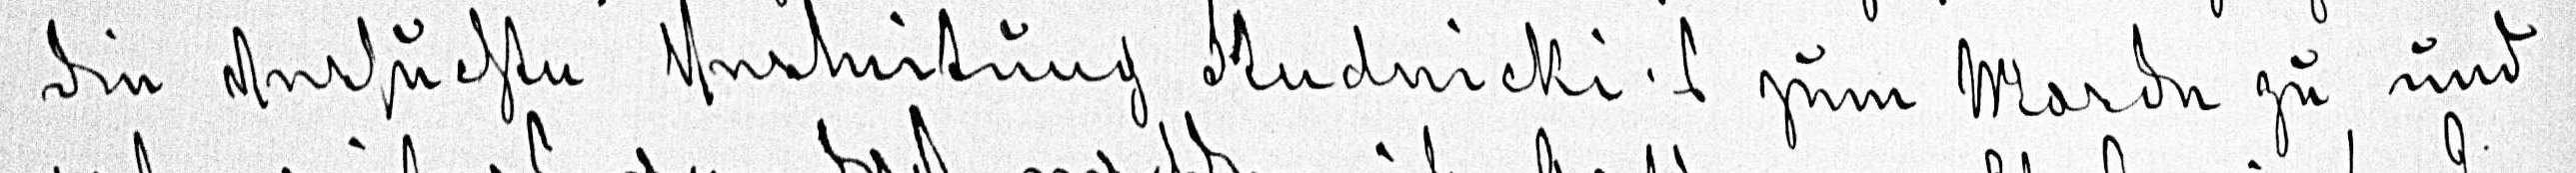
die Versuchte Verleitung Studnicki’s zum Morde zu und
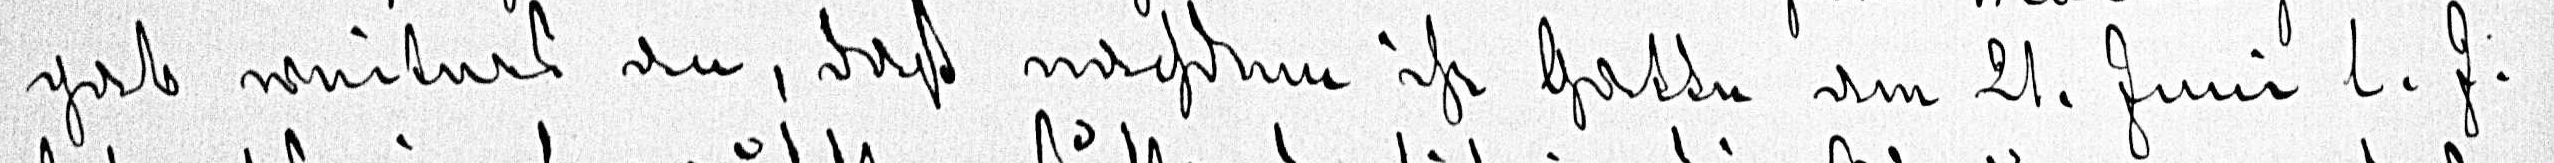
gab weiters an, daß nachdem ihr Gatte am 21. Juni l. J.
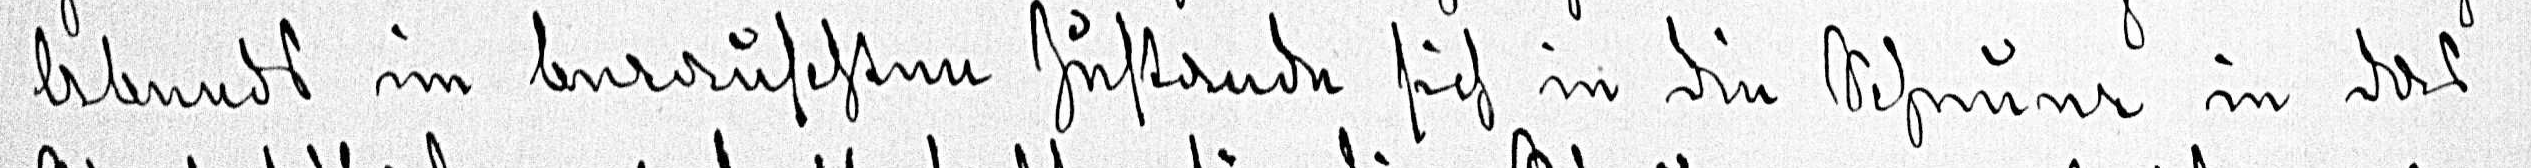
Abends im berauschten Zustande sich in die Scheune in das
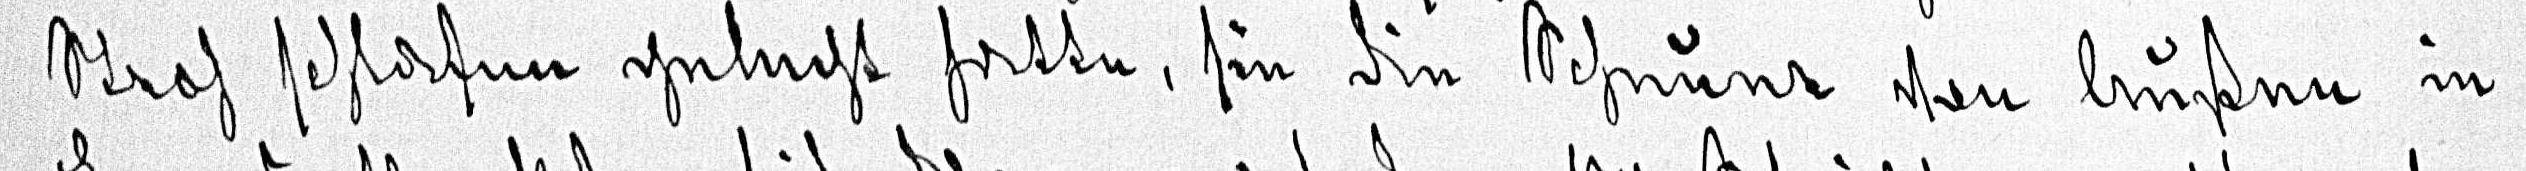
Stroh schlafen gelegt hatte, sie die Scheune von Außen in
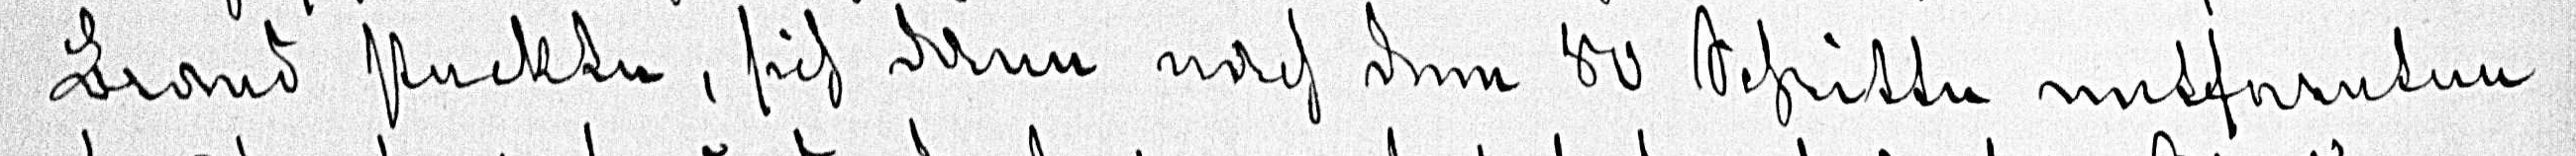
brand steckte, sich dann nach dem 80 Schritte entfernten
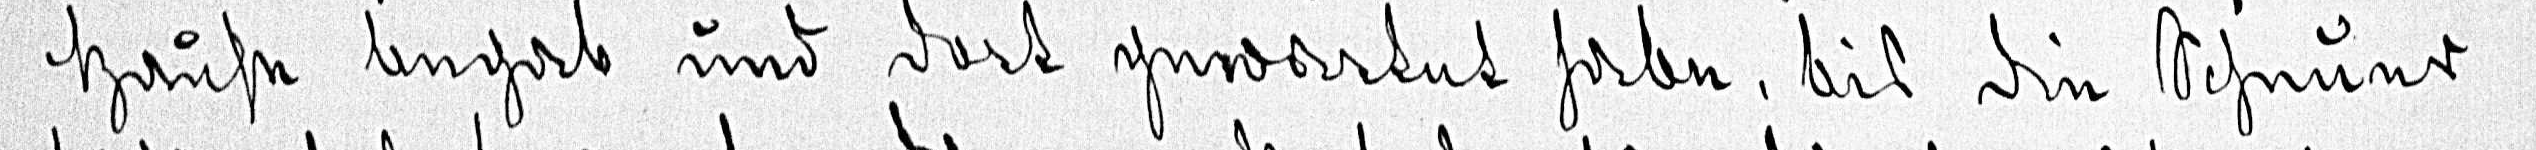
Hause begab und dort gewartet habe, bis die Scheune
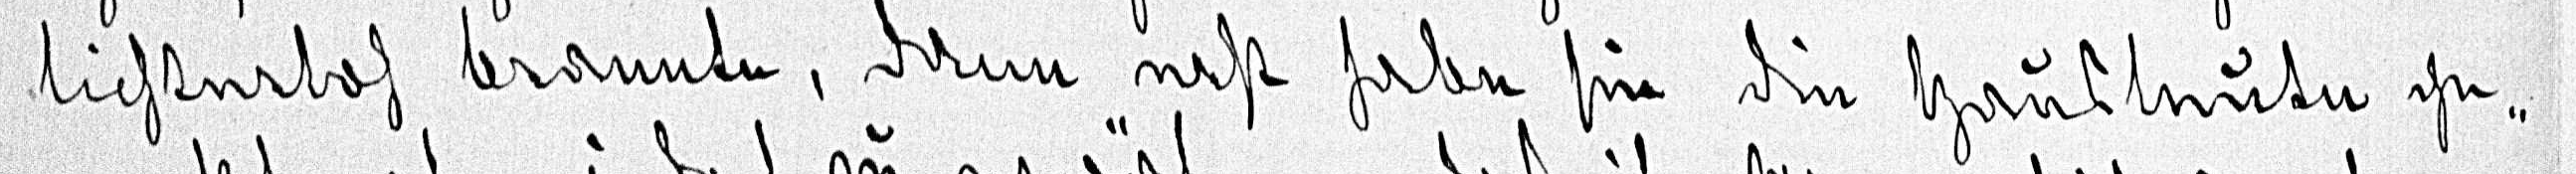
lichterloh brannte, dann erst habe sie die Hausleute ge¬
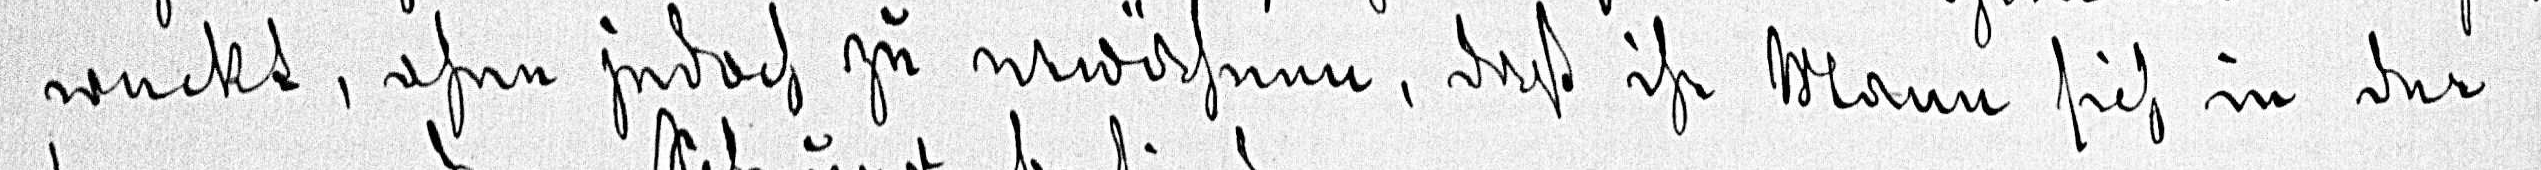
weckt, ohne jedoch zu erwähnen, daß ihr Mann sich in der
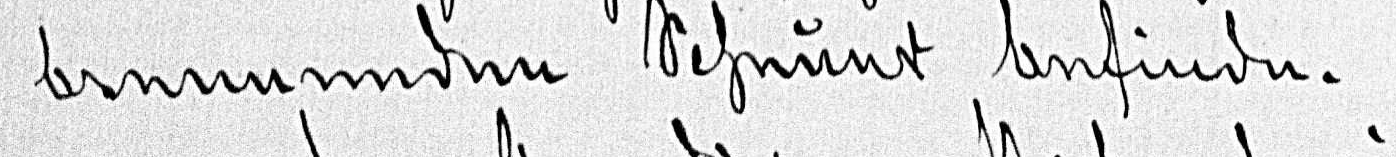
brennenden Scheune befinde.
